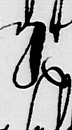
P¬
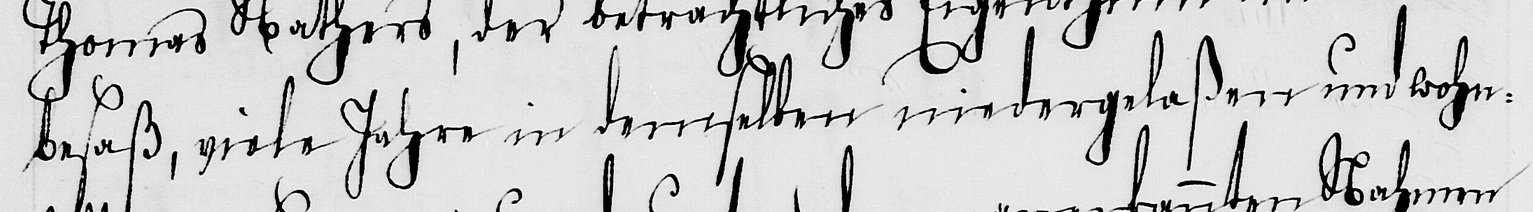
besaß, viele Jahre in demselben niedergelaßen und wohn¬
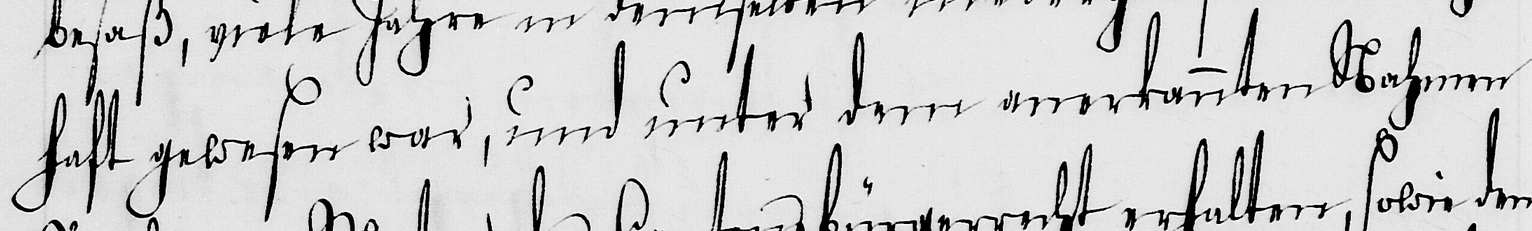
haft gewesen war, und unter dem anerkannten Nahmen
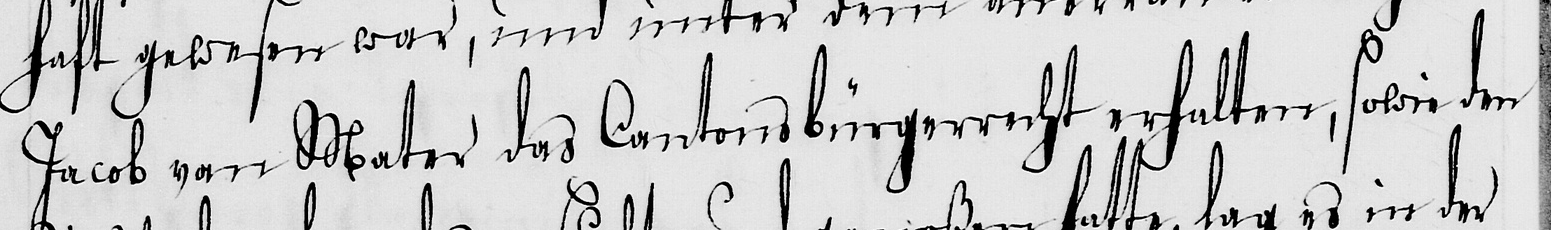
Jacob van Mater das Cantonsbürgerrecht erhalten, sowie den
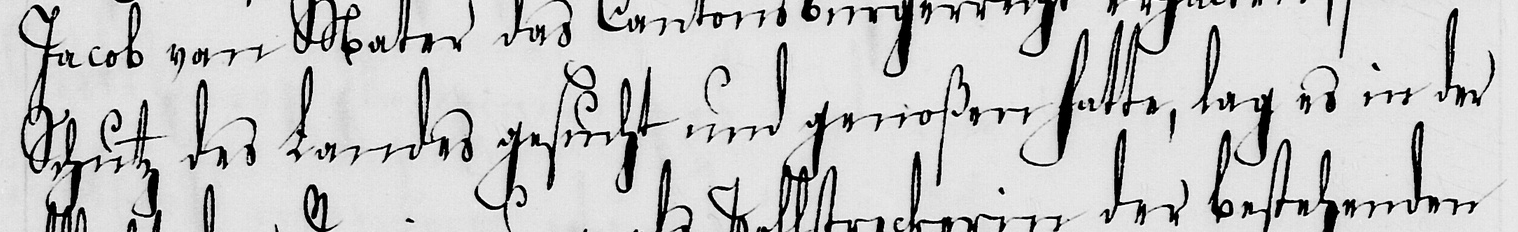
Schutz des Landes gesucht und genoßen hatte, lag es in der
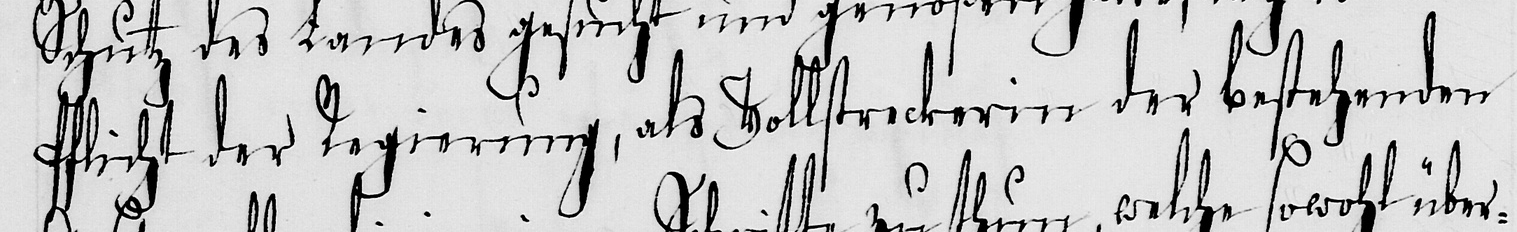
flicht der Regierung, als Vollstreckerin der bestehenden
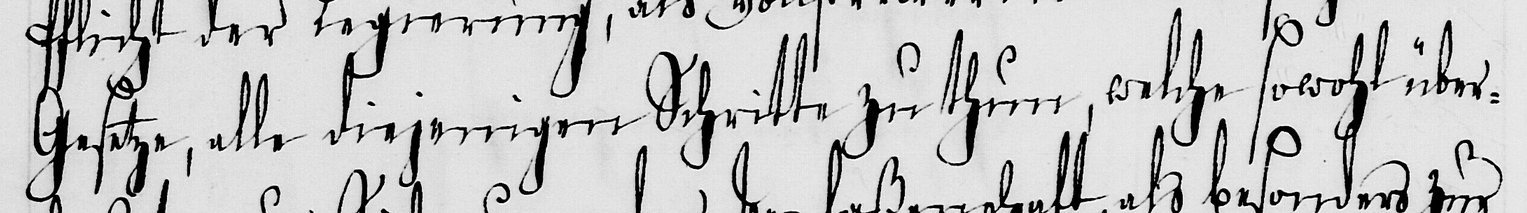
Gesetze, alle diejenigen Schritte zu thun, welche sowohl über¬
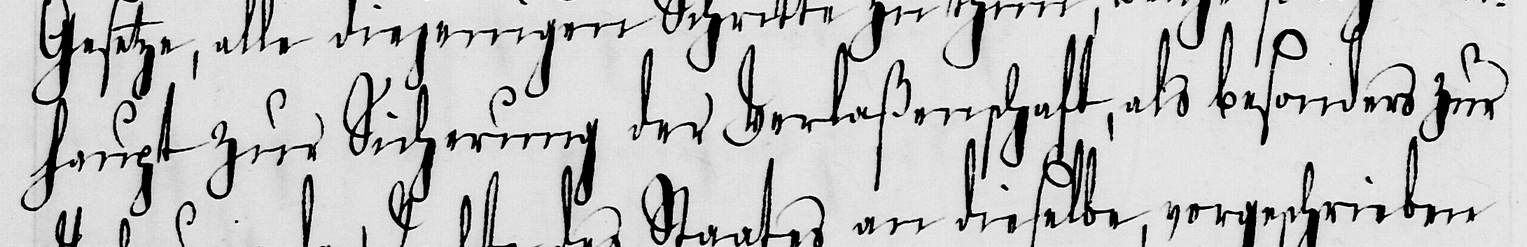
haupt zur Sicherung der Verlaßenschaft, als besonders zur
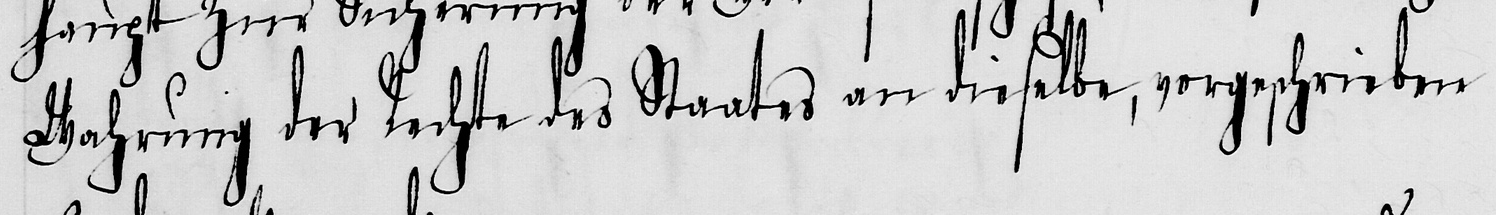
Wahrung der Rechte des Staates an dieselbe, vorgeschrieben
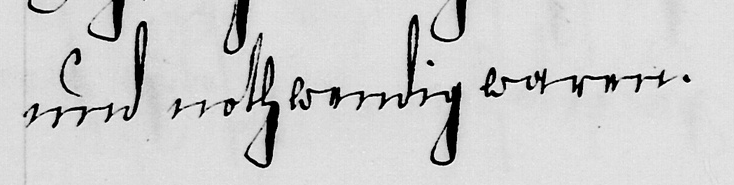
und nothwendig waren.
